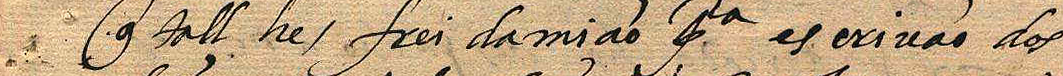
q̄ tall he / frei damiaõ pra escriuaõ dos
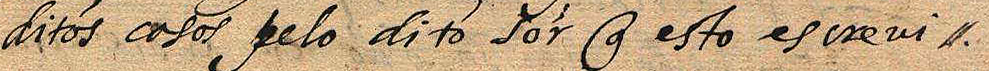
ditos casos pelo ditō sor̄ q̄ esto escreui //.
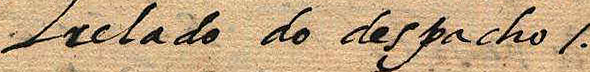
Trelado do despacho /.
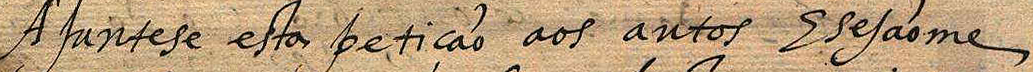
AJuntese esta petiçaõ aos autos E sejaõme
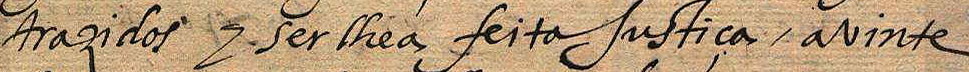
trazidos E ser lhe a feita Justiã / a vinte
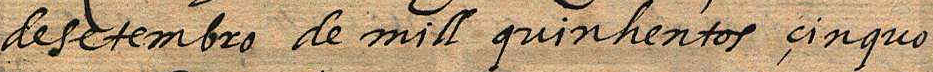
de setembro de mill quinhentos çinquo
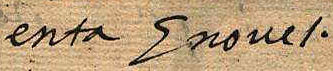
enta E noue /.
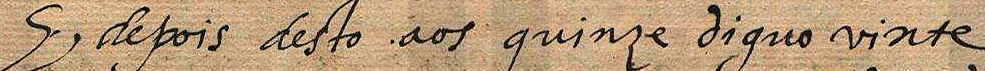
E depois desto aos quinze diguo vinte
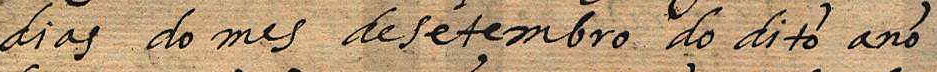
dias do mes de setembro do ditō anō
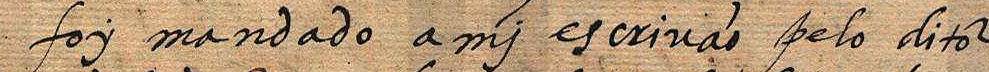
foy mandado a mj̄ escriuaõ pelo ditō
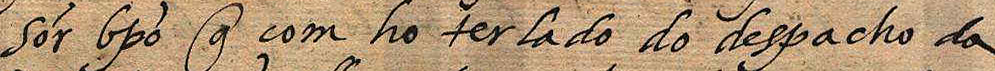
sor̄ bpō q̄ com o terlado do despacho da
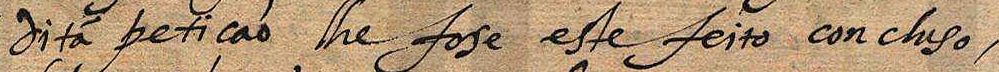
ditā petiçaõ lhe fose este feito concluso /
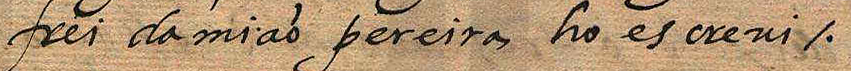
frei damiaõ pereira ho escreui /.
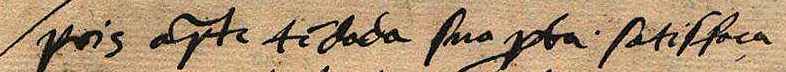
pois a p̄te tē dada sua ꝓva. satisfaça
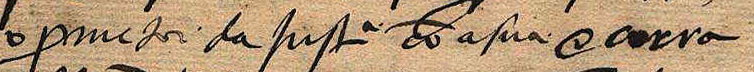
o ꝓmetor. da Justa c̄o a sua e corra
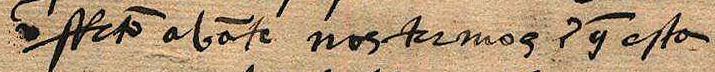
o ffctō avāte nos termos ē q̄ esta
